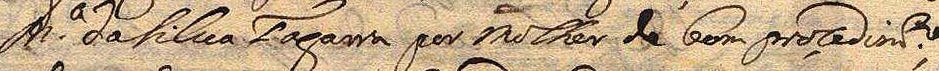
M.a da Silua Tagarra por molher de bom proçedim.to,
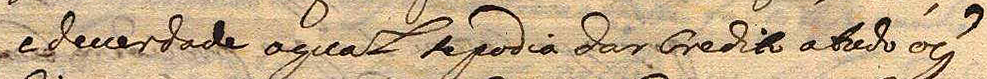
e de uerdade a qual se podia dar credito a tudo o q̄
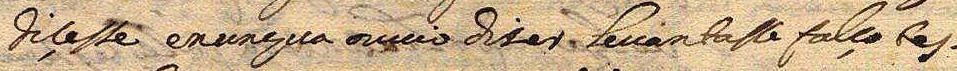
diçesse e nunqua ouuio diser leuantasse falço tes
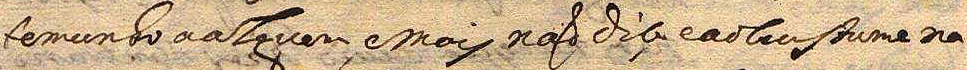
temunho a alguem, e mais naõ diçe e ao custume na
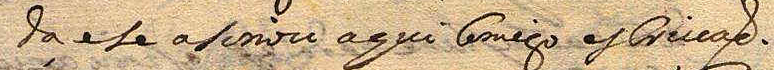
da, e se asinou aqui Comigo esCriuaõ.
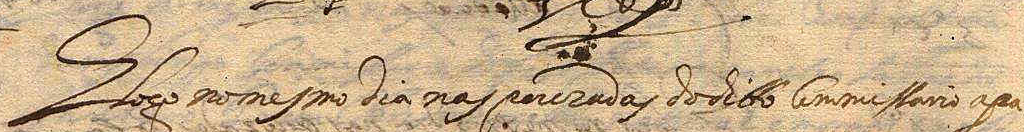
E logo no mesmo dia nas pouzadas do ditto Commissario apa
